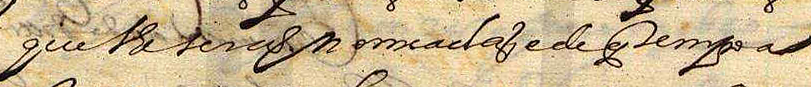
que lhe seraõ nomeadas e de q̄ tempo a
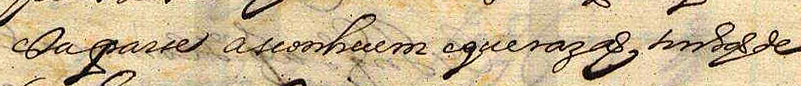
esta parte as conhecem e que razaõ tinhaõ de
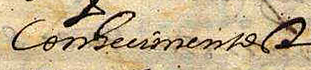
conhecimentos
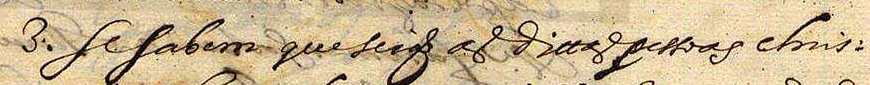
3. Se Sabem que seiaõ as dittas pessoas chris
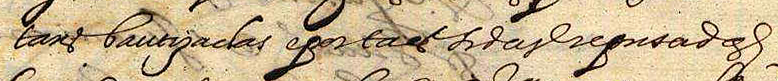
tans bautizadas e por taes tidas E reputadas
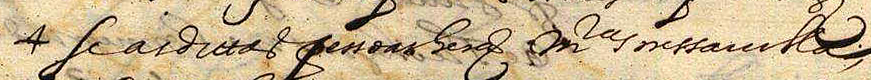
4. Se as dittas pessoas heraõ mras nessa uilla
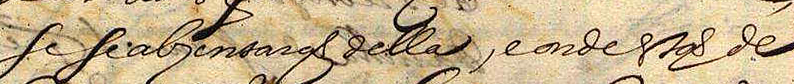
Se Se abzentaraõ della, e onde estaõ de
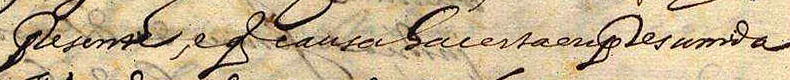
presente, e q̄ causa ha certa ou presumida
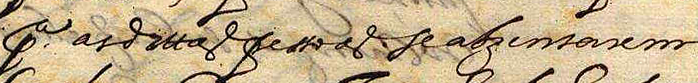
p.a as dittas pessoas se absentarem
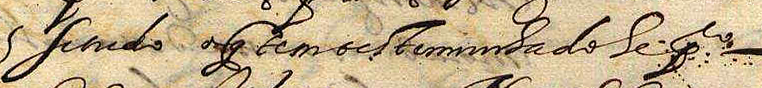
5. Se tudo o q̄ tem testemunhado he p.co
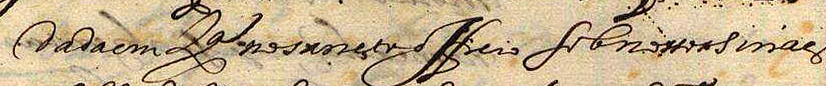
dada em Lxa no sancto officio sob nossos sinaes
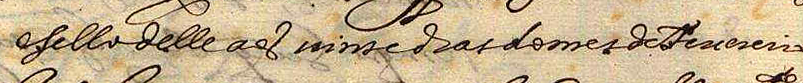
e Sello delle aos uinte dias do mes de Feuereiro
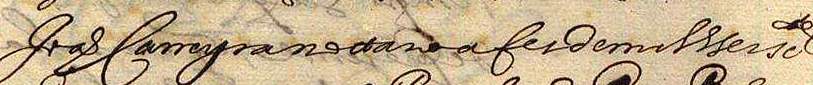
Joaõ Carreyra nottario a fes de mil E seis ctos
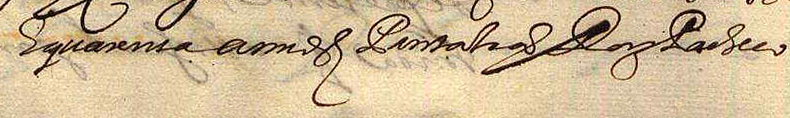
E quarenta annos PantaIiaõ Roez Pacheco
